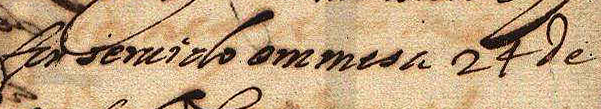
for seruido em mesa 24 de
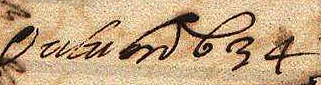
Outubro 634
